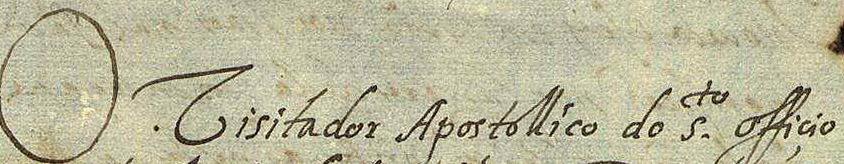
O Visitador Apostollico do s.to offiçio
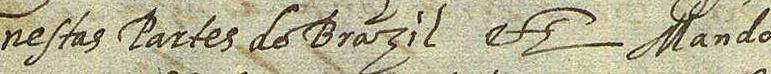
nestas Partes do Brazil &ꝭ Mando
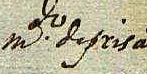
m.do de prisaõ
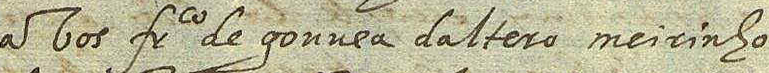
a vos fr.co de gouuea daltero meirinho
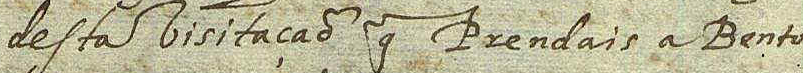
desta visitaçaõ q̄ Prendais a Bento
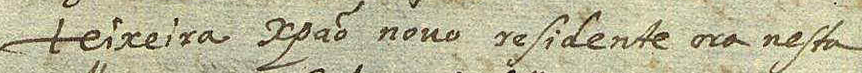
teixeira xpaõ nouo residente ora nesta
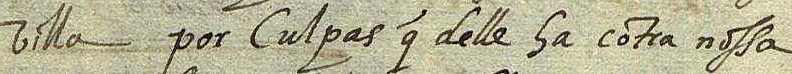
villa por Culpas q̄ delle ha cōtra nossa
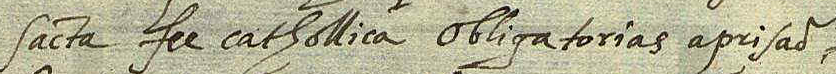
sac̄ta fee cathollica Obligatorias a prisaõ,
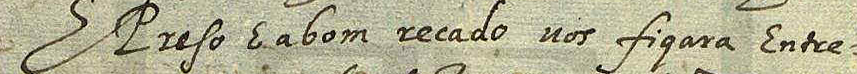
E Preso E a bom recado uos fiqara Entre
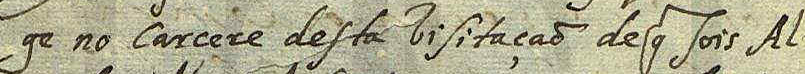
ge no Carçere desta visitação de q̄ sois Al
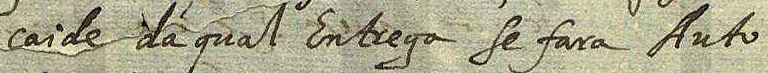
caide da qual Entrega se fara Auto
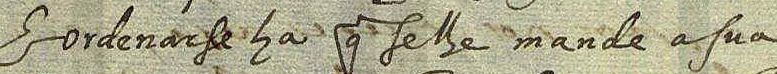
E ordenarse ha q̄ se lhe mande a sua
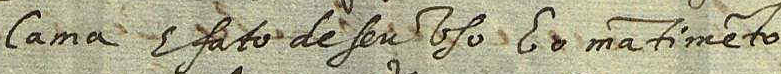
Cama E fato de seu vso E o mātimēto
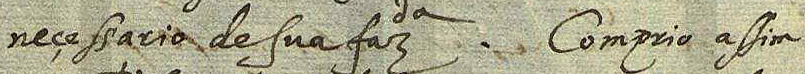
neçessario de sua fazda . Comprio assim
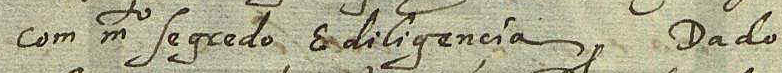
com mto segredo E diligençia Dado
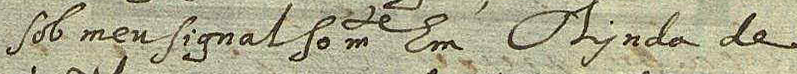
sob meu signal somte Em Olynda de
